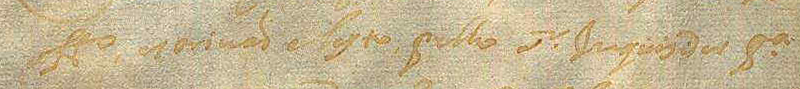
offo, escriuaõ eleyto pello s.r Inquisidor p.a
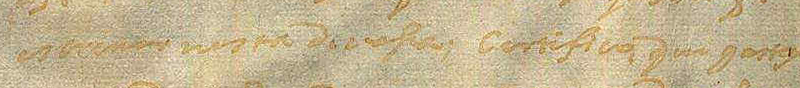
escreuer nesta deuassa; certifico, que gastey
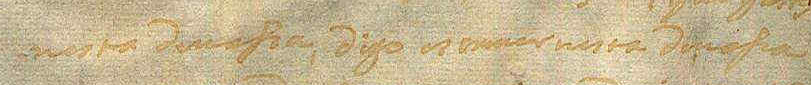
nesta deuassa, digo escreuer nesta deuassa
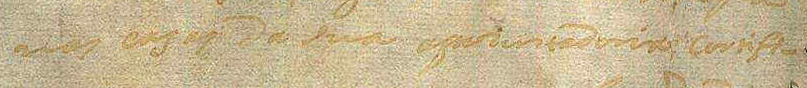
nas casas da sua apozentadoria, certifi
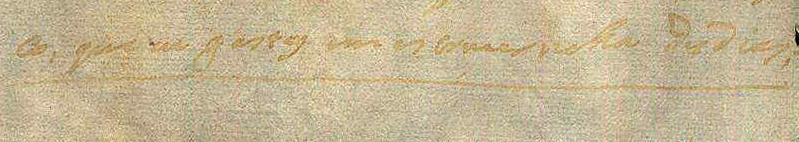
co, que eu gastey em escreuer nella des dias,
